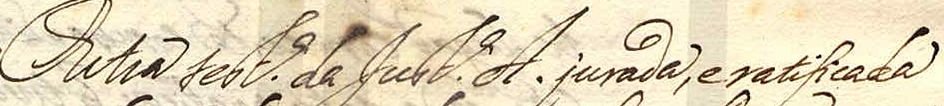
Outra test.a da Just.a A. jurada, e ratificada
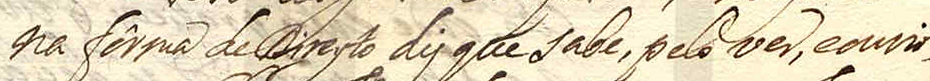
na fôrma de Direyto dis que sabe, pelo ver, e ouvir
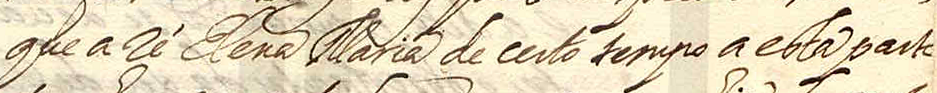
que a Ré Elena Maria de certo tempo a esta parte
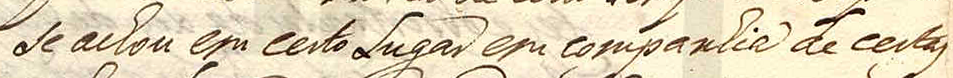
se achou em certo Lugar em companhia de certas
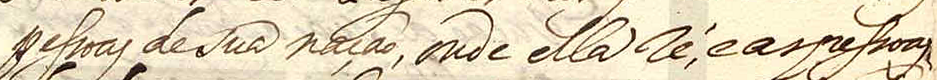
pessoas de sua naçaõ, onde ella Ré, e as pessoas
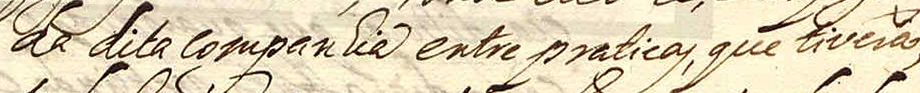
da dita companhia entre praticas, que tiveraõ,
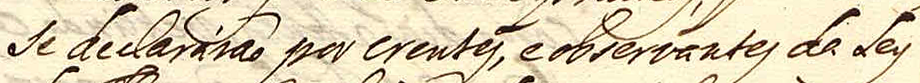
se declaráraõ por crentes, e observantes da Ley
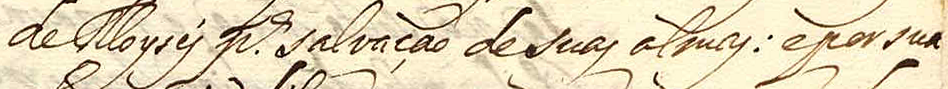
de Moysés p.a salvaçaõ de suas almas: e por sua
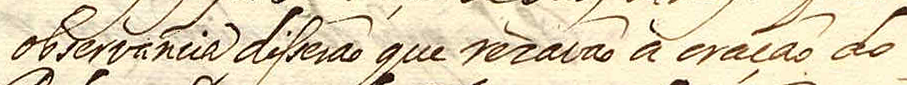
observancia disserão que rezavão a oração do
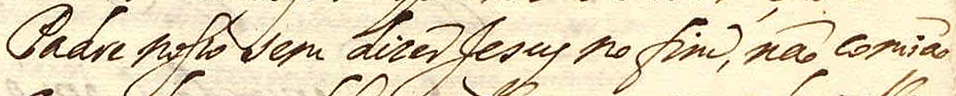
Padre nosso sem dizer Jesus no fim, não comião
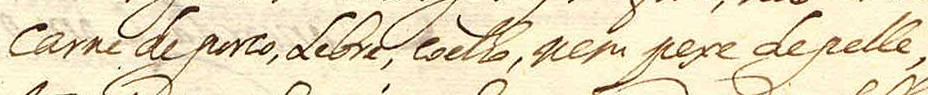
carne de porco, Lebre, coelho, nem pexe de pelle,
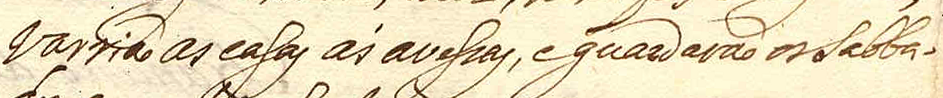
varrião as casas ás avessas, e guardavão os Sabba
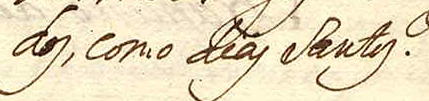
dos, como dias Santos.
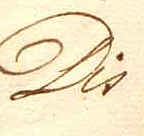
Dis
